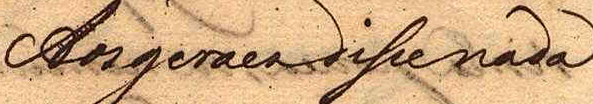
Aos geraes disse nada
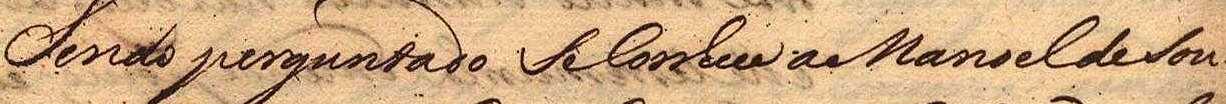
Sendo perguntado se Conhece a Manoel de sou
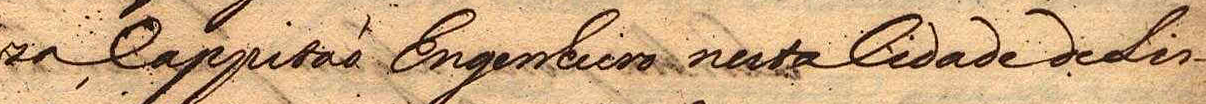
za, Cappitaõ Engenheiro nesta Cidade de Lis
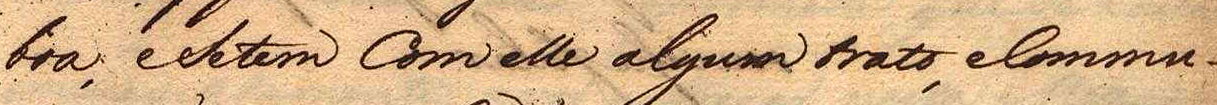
boa, e Se tem Com elle algum trato, e Commu
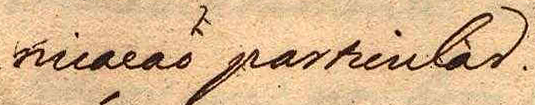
nicaçaõ particular?
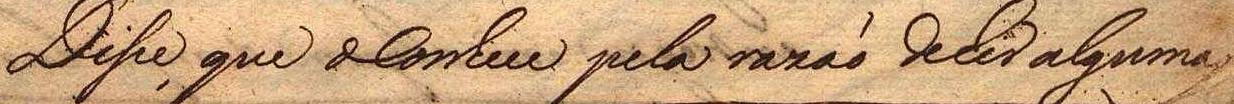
Disse, que o Conhece pela razaõ de hir alguma
